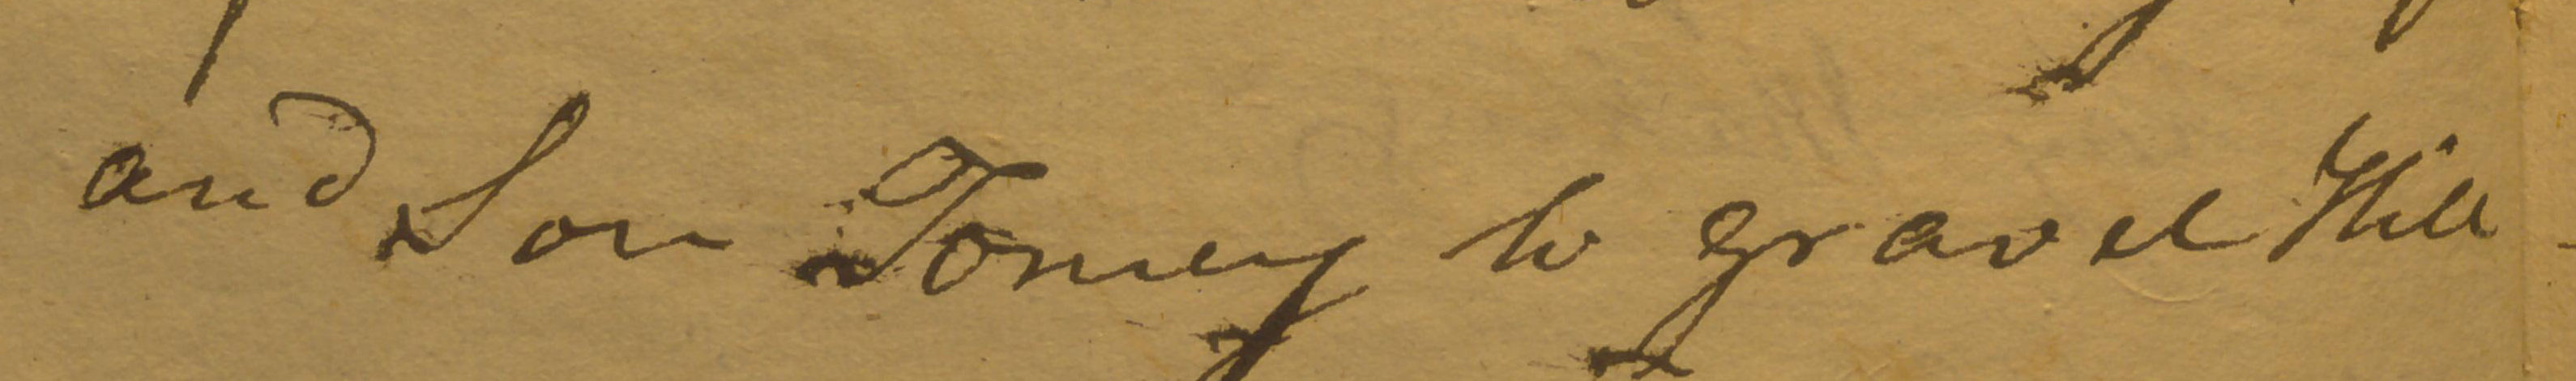and son Tomey to gravel Hill
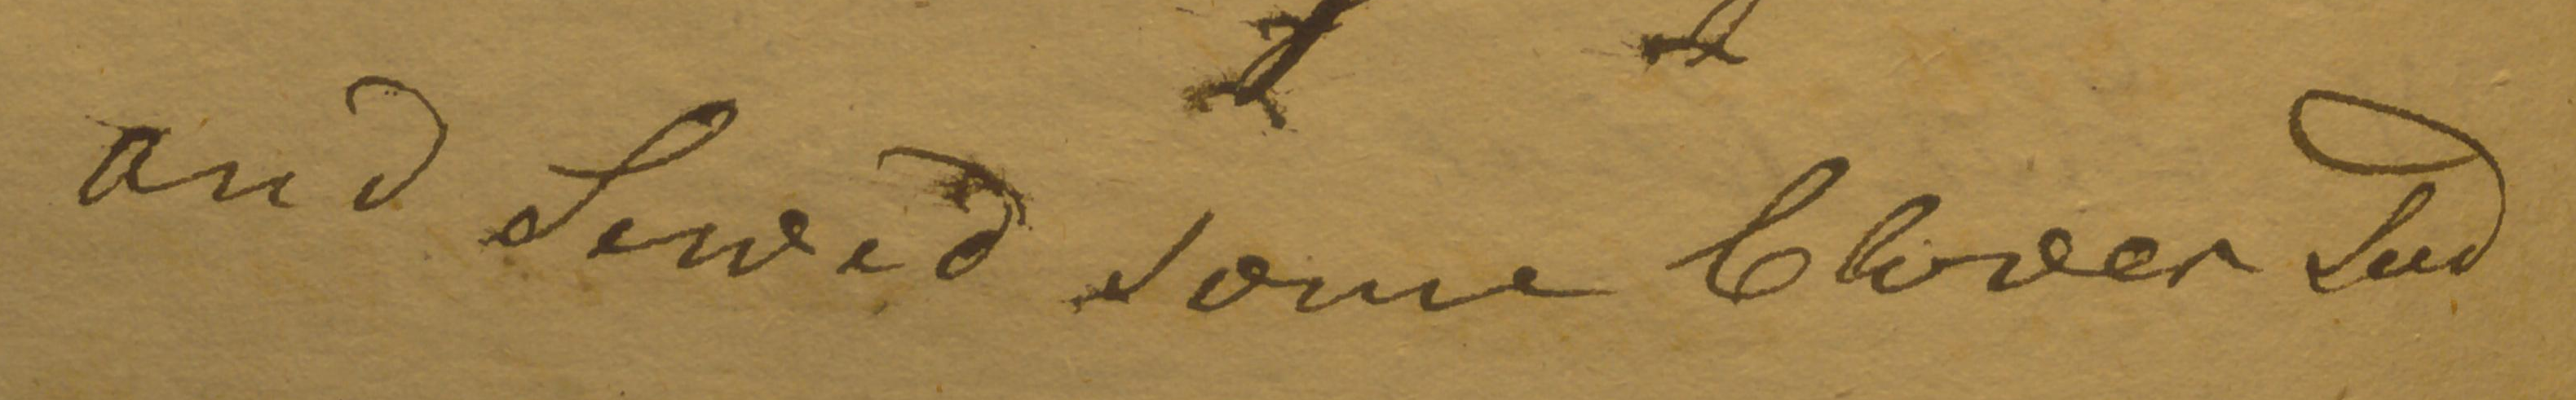and sewed some Clover seed
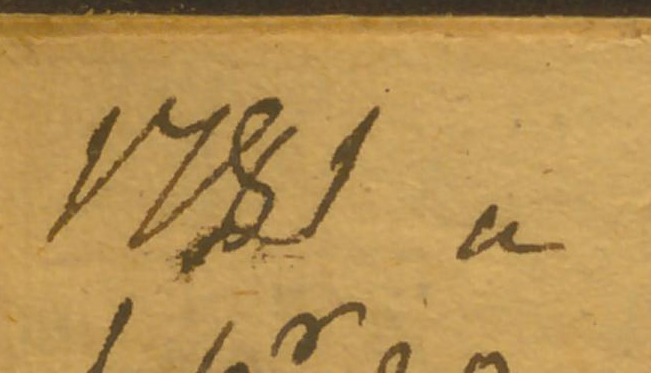1781
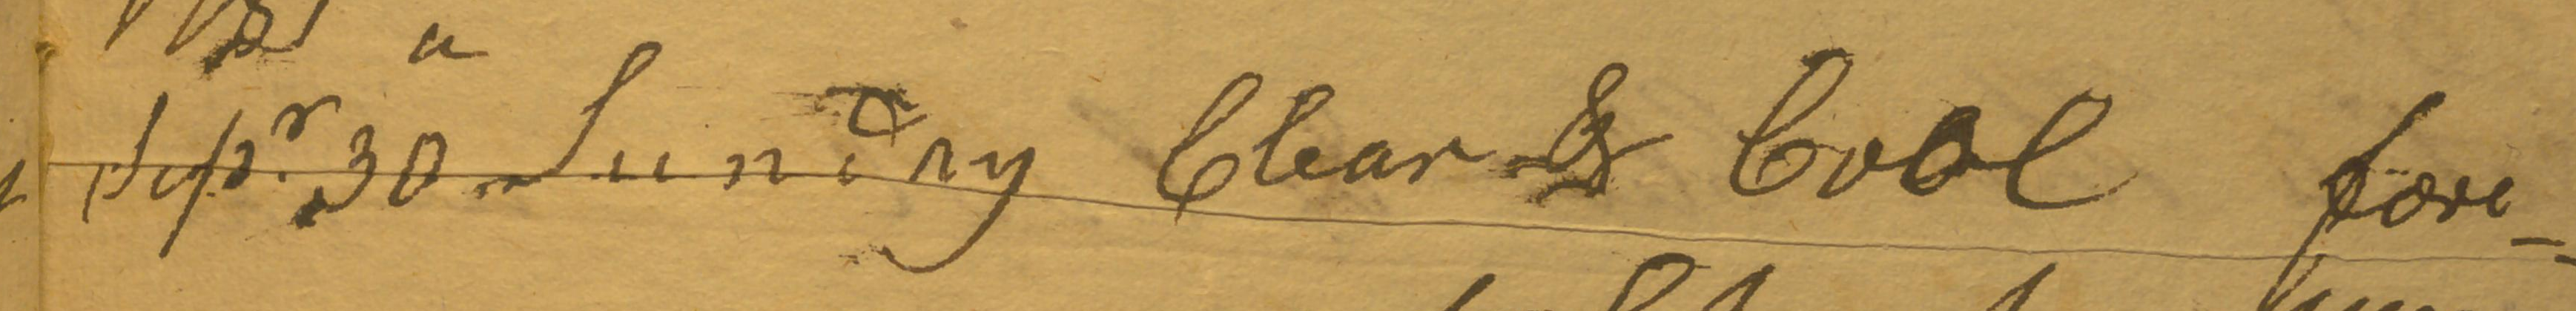Sep^r. 30^th Sunday Clear & Cool, fore
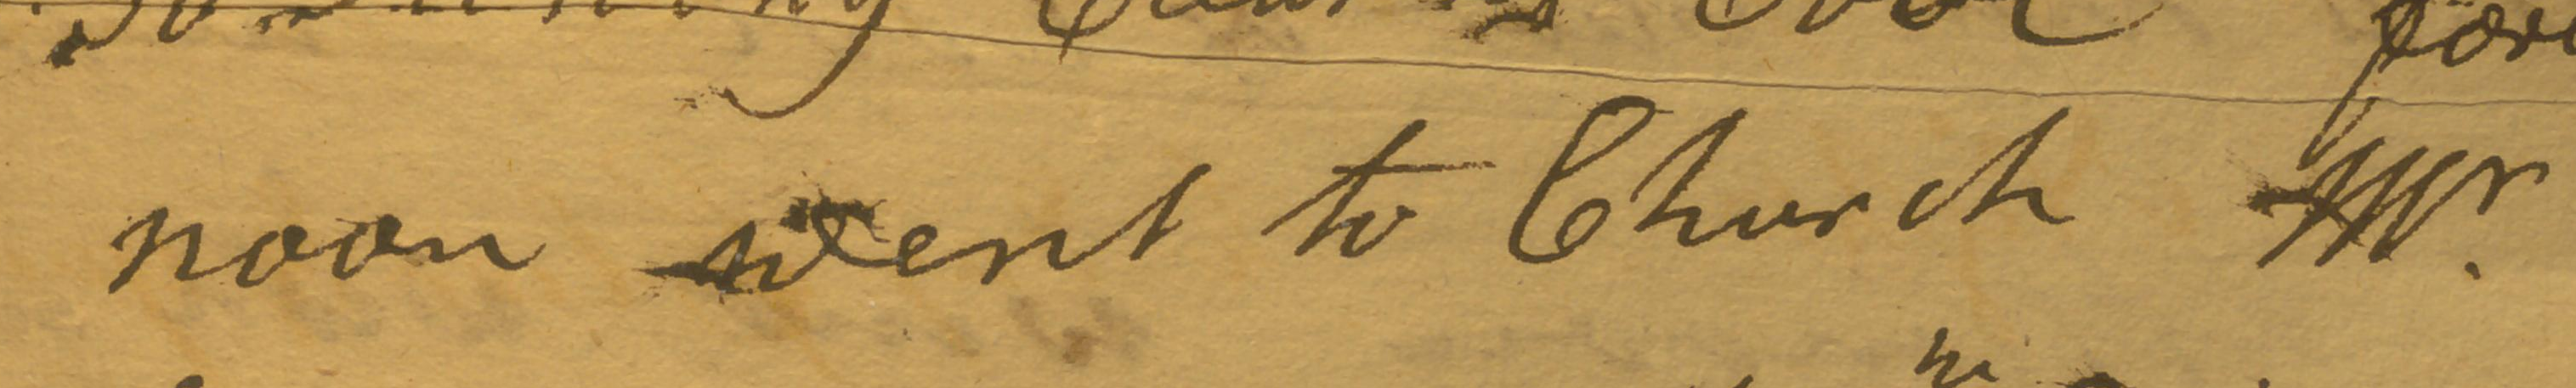noon went to Church M^r.
